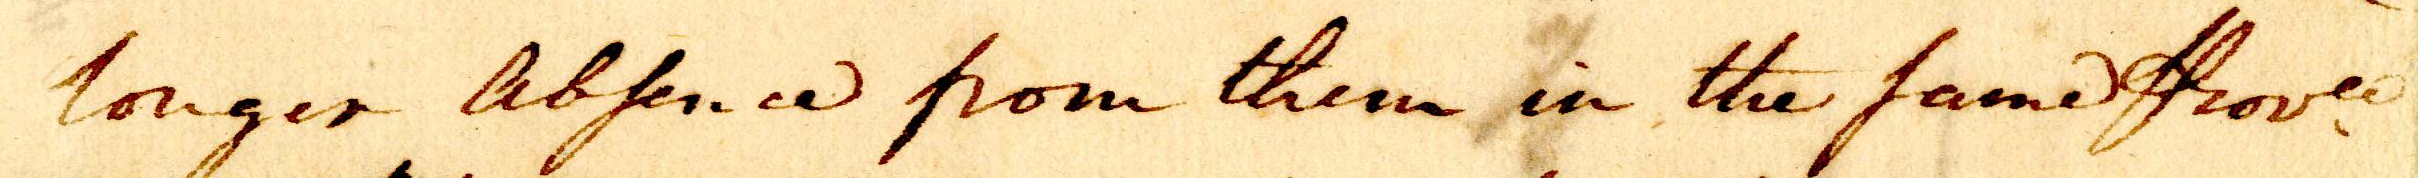longer Absence from them in the same Prov^e.
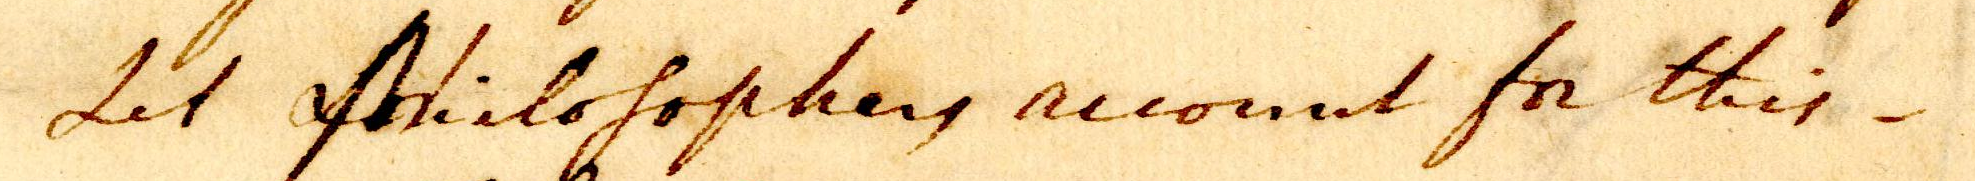Let Philosophers account for this
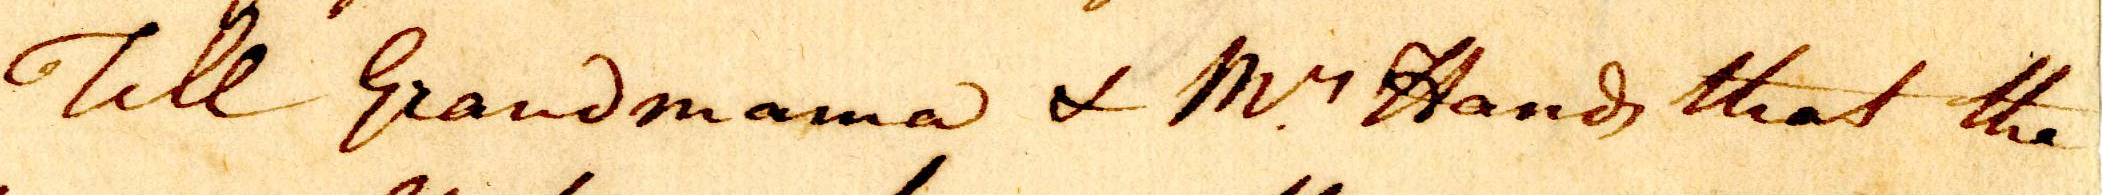Tell Grandmama & M^rs Hand that the
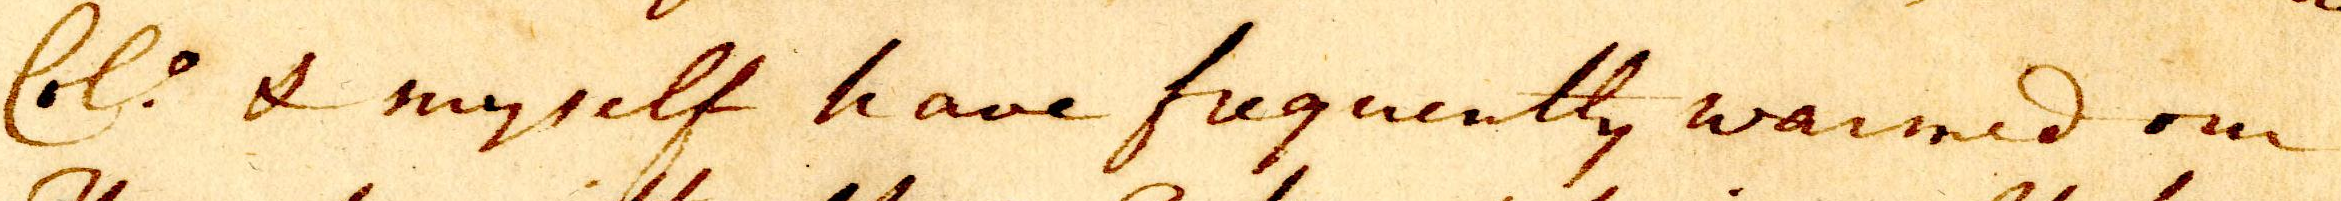Col^o. & myself have frequently warmed our
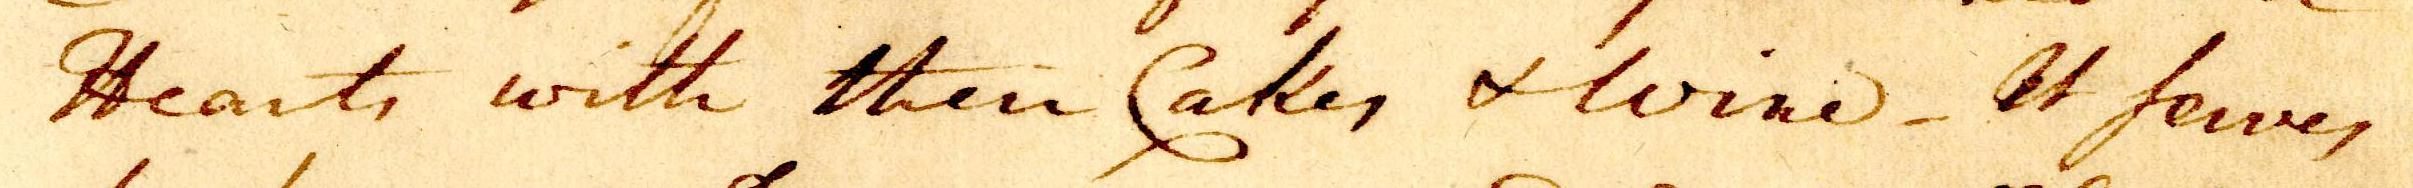Hearts with their Cakes & wine. It serves
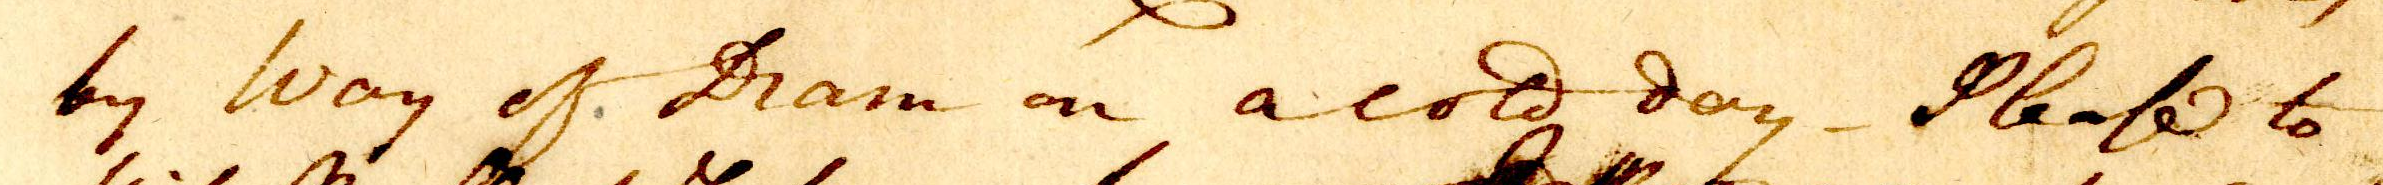by way of Dram on a cold day Please to
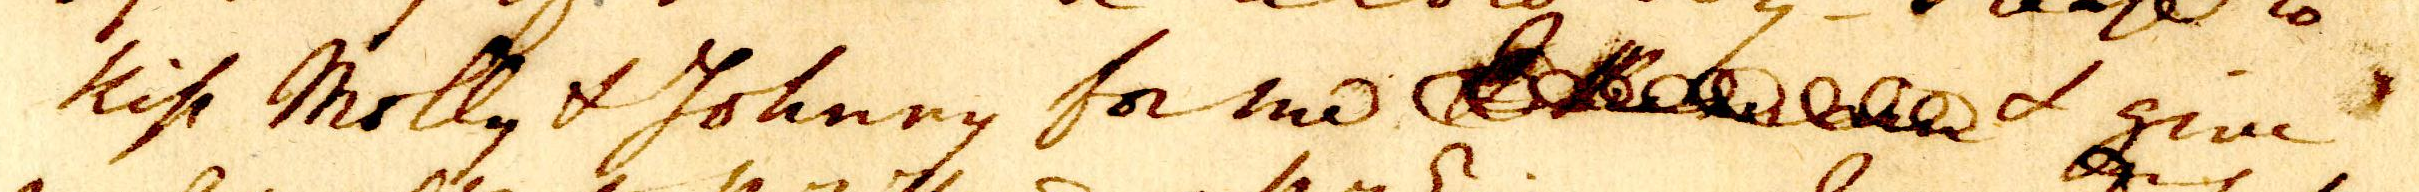kiss Molly & Johnny for me [________] & give
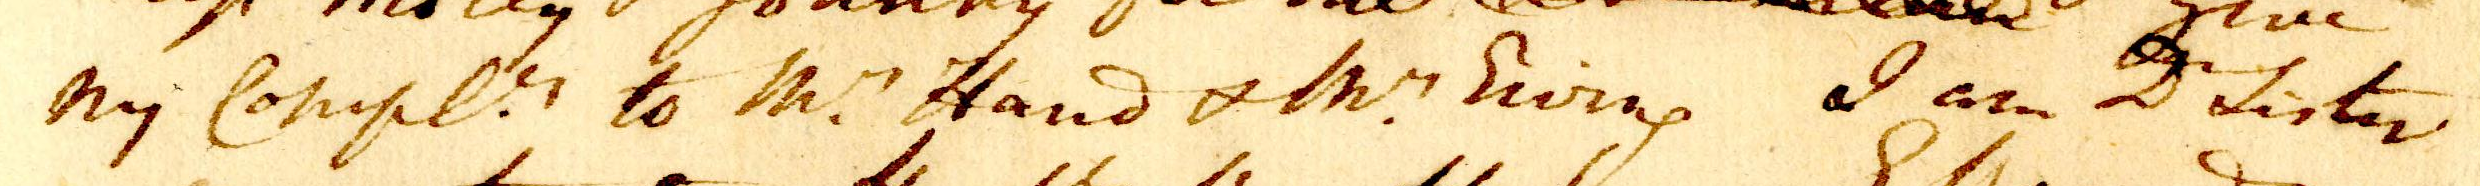my Compl^s to M^rs. Hand & M^rs. Ewing I am D^r Sister
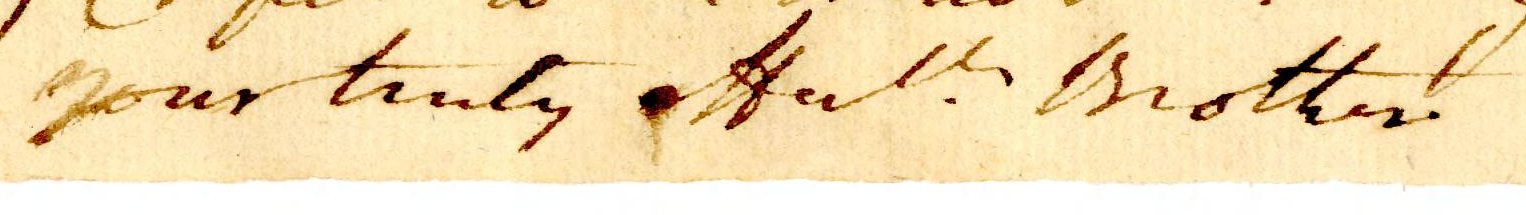your truly affect^e. Brother
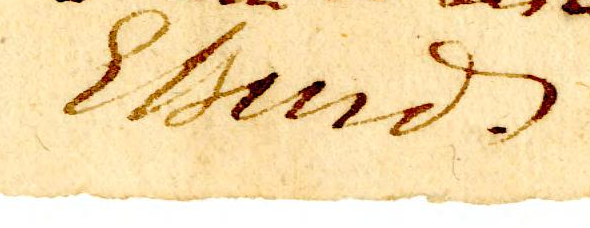EBurd
